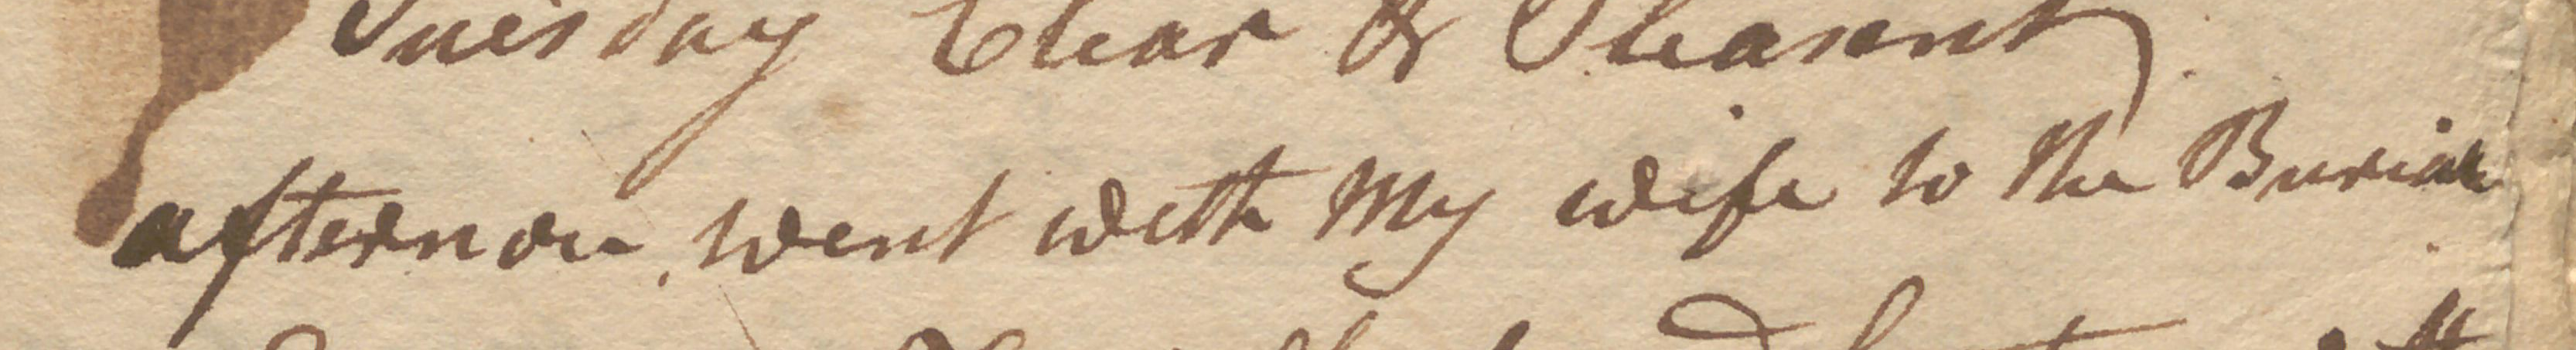afternon went with My wife to the Burial
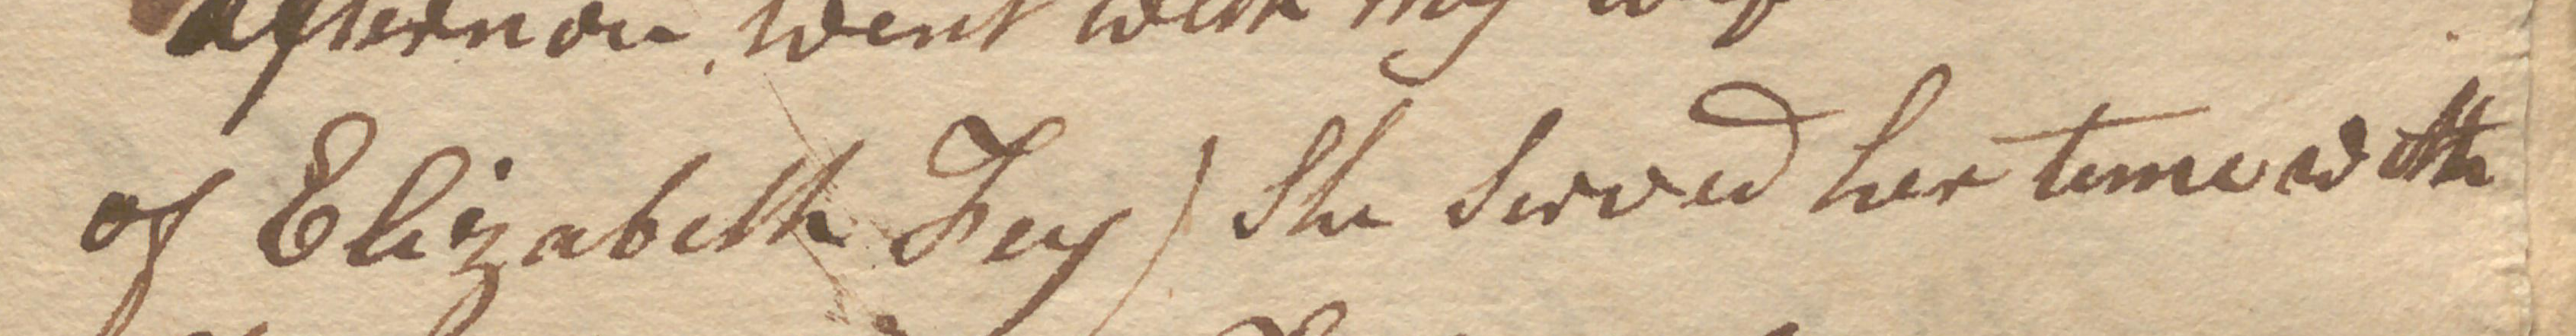of Elizabeth Fey) she served her time with
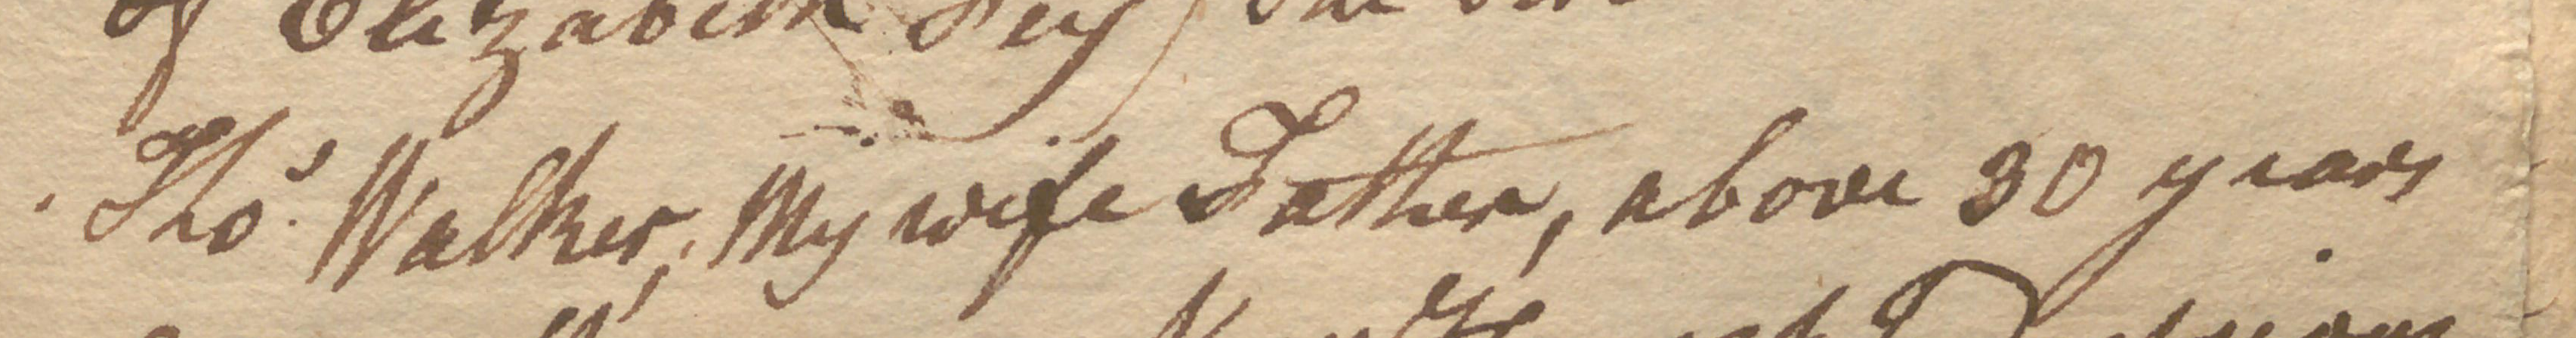Tho^s. Walker, My wife Father, above 30 years
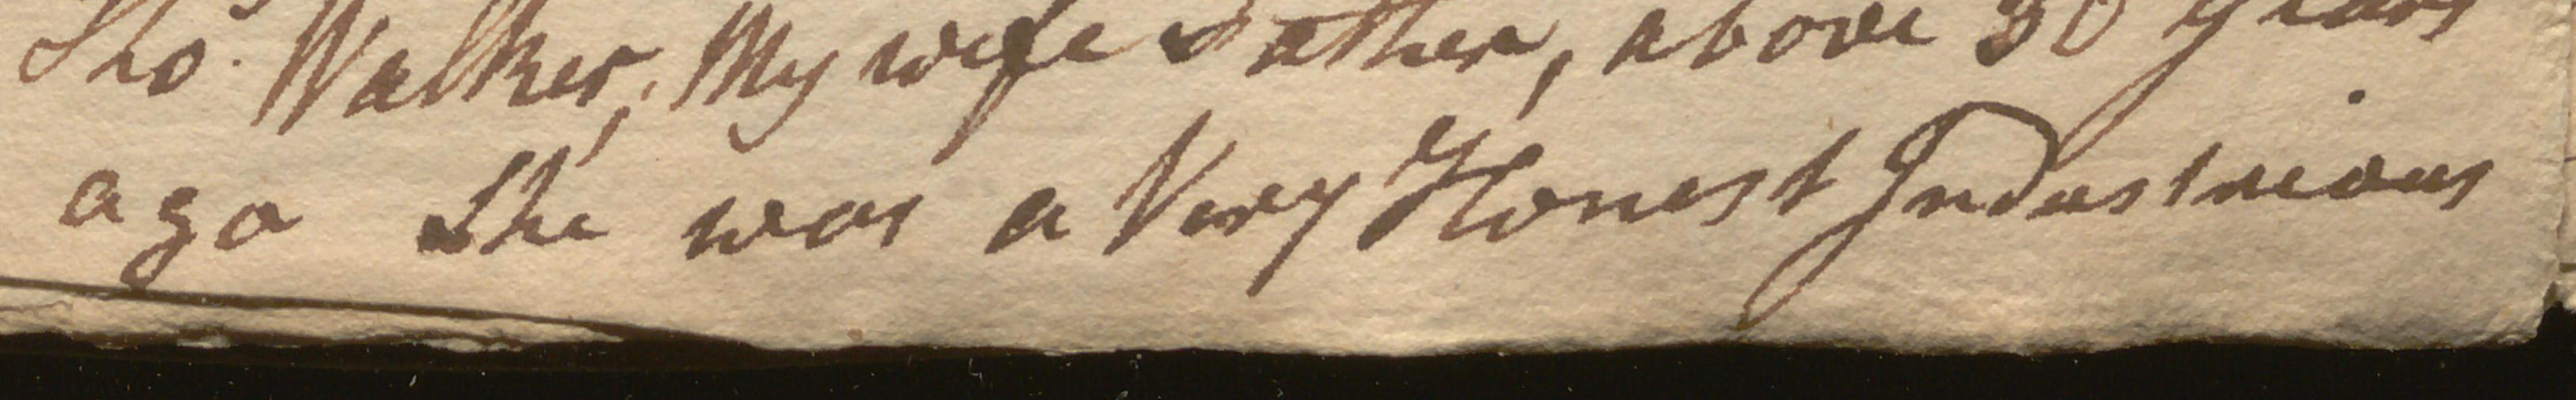ago she was a Very Honest Industrious
